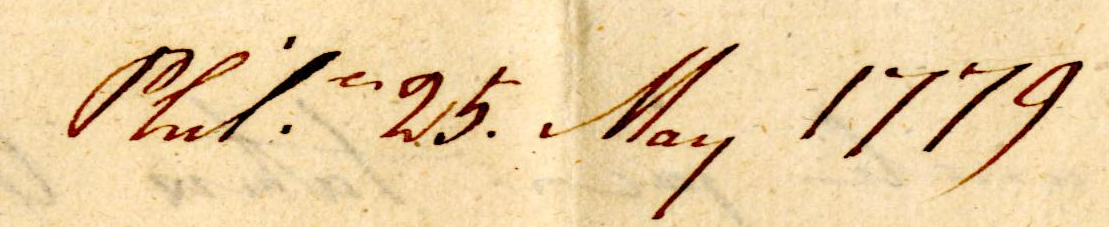Phil^a. 25. May 1779
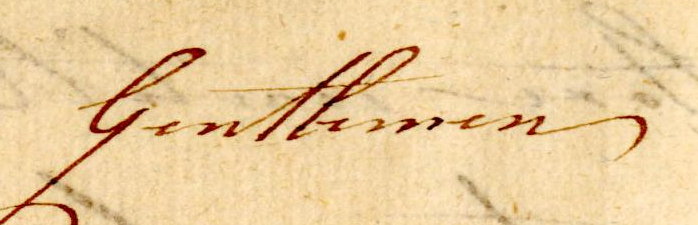Gentlemen
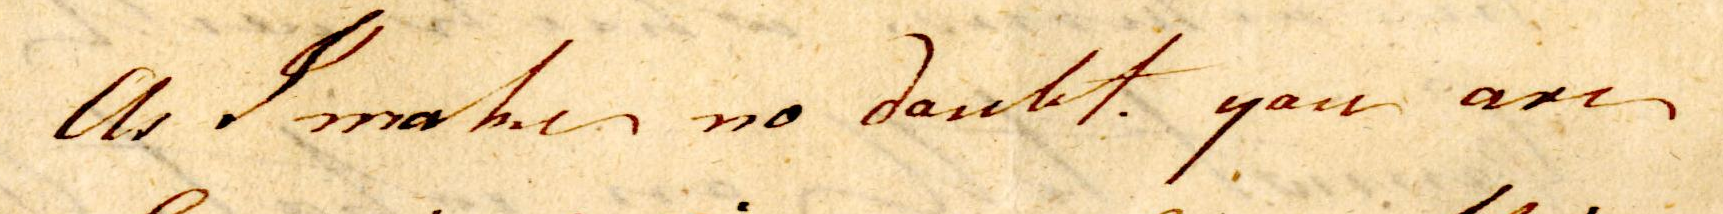As I make no doubt. you are
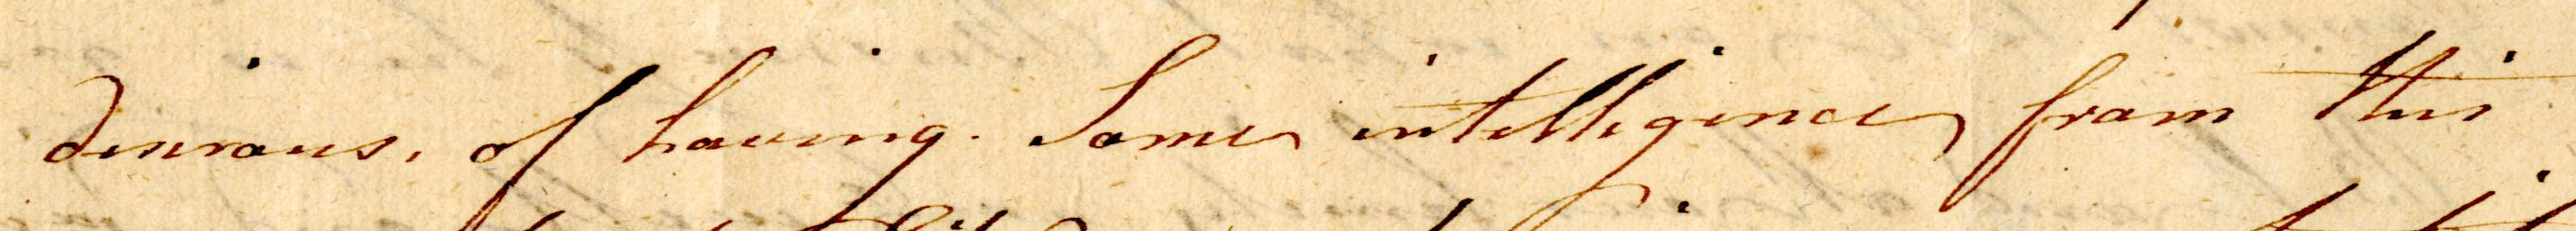desirous, of having Some intelligence from this
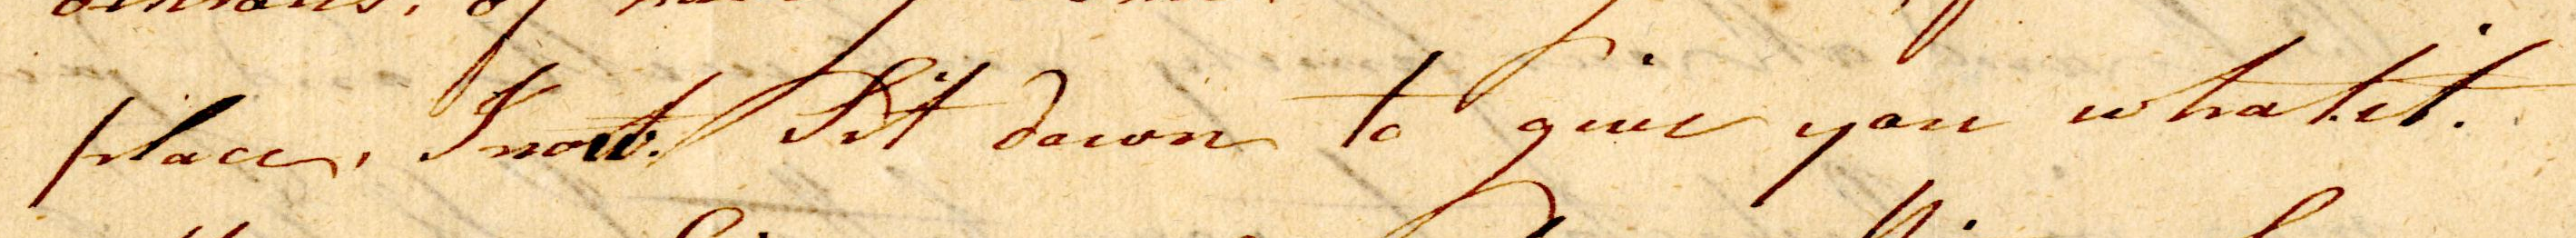place, I now Sit down to give you what it
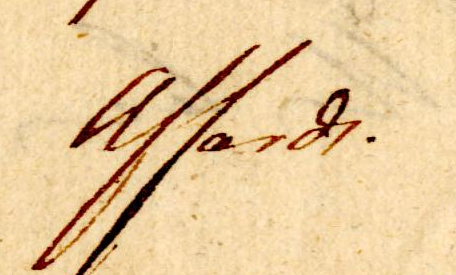Affords.
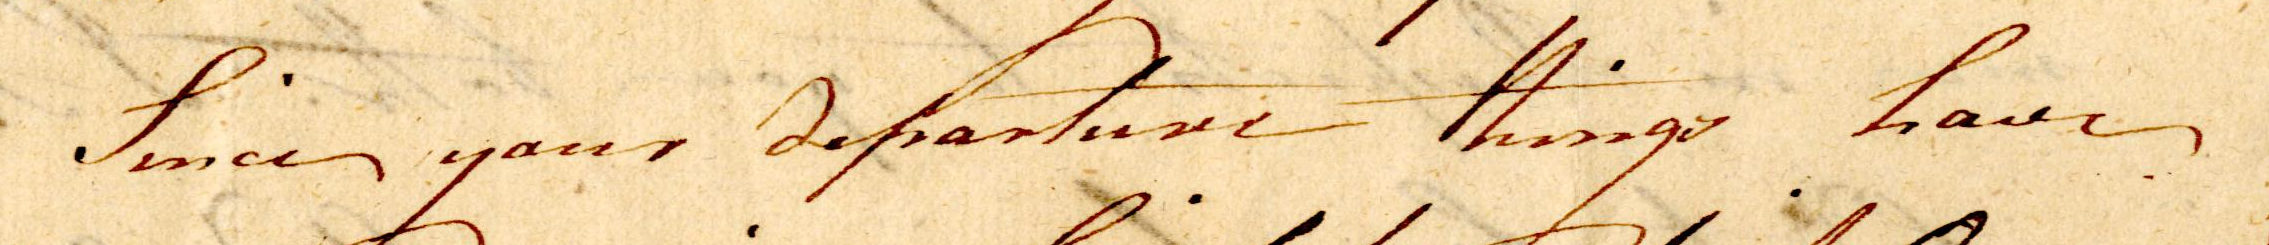Since your departure things have
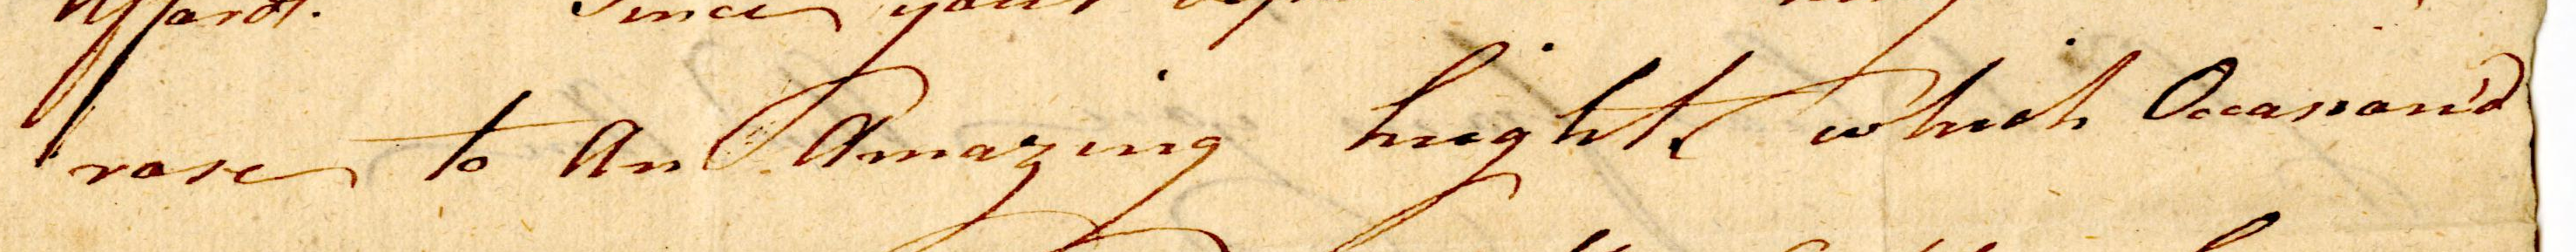rose to an Amazing hight which Occasian'd
